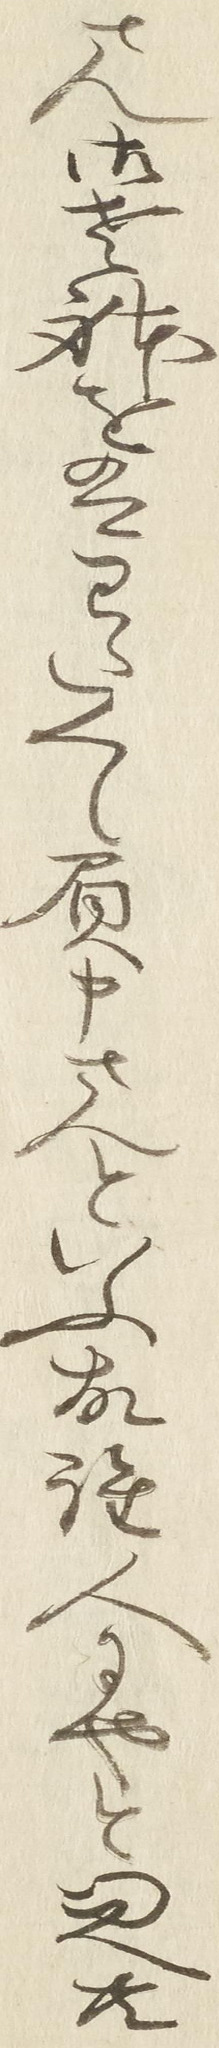さん御老体を右わたくし負申さんといふ故誰人にやと問へ共
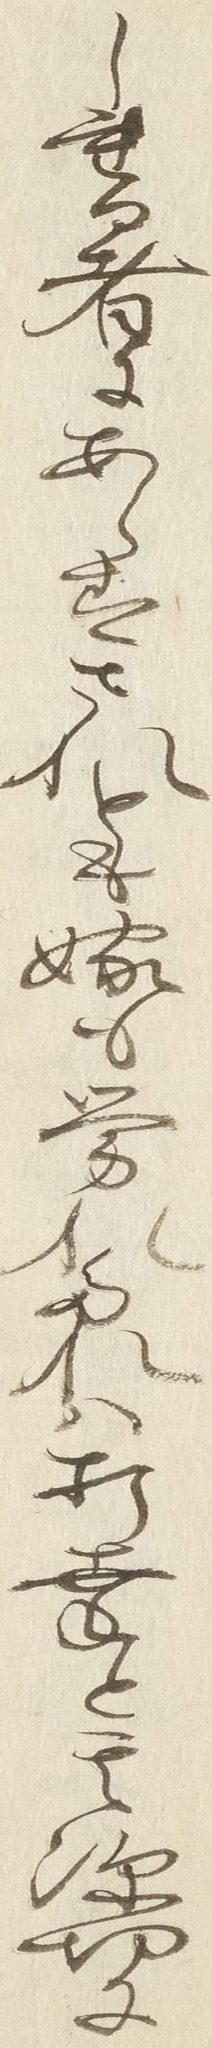しれる者にあらすされとも嫁も労れたれは折幸と其深切に
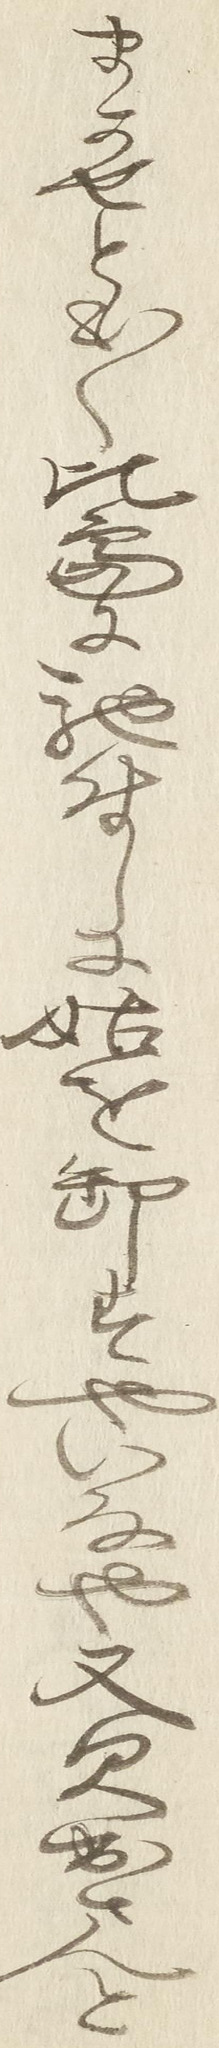まかせとも〳〵比島に馳付しに姑を卸すやいなや又見出さんと
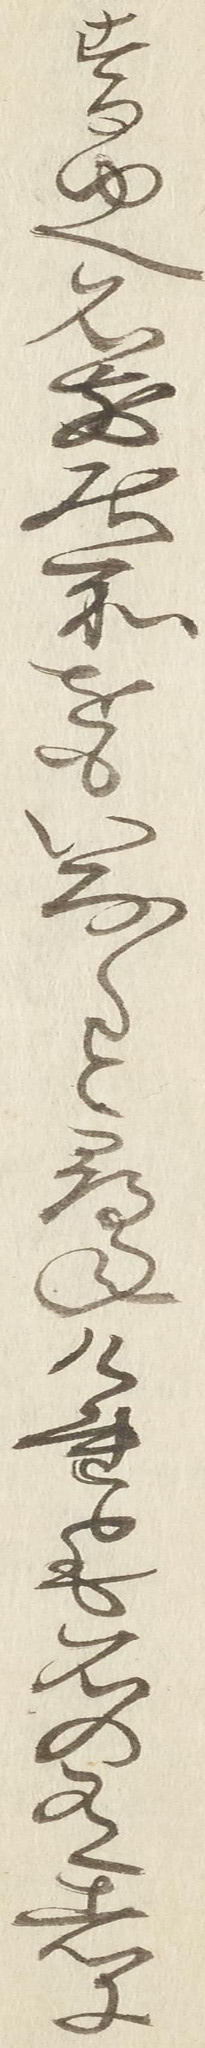るゆへ名前居所をもいろ〳〵と尋ねけれとも名の有者に
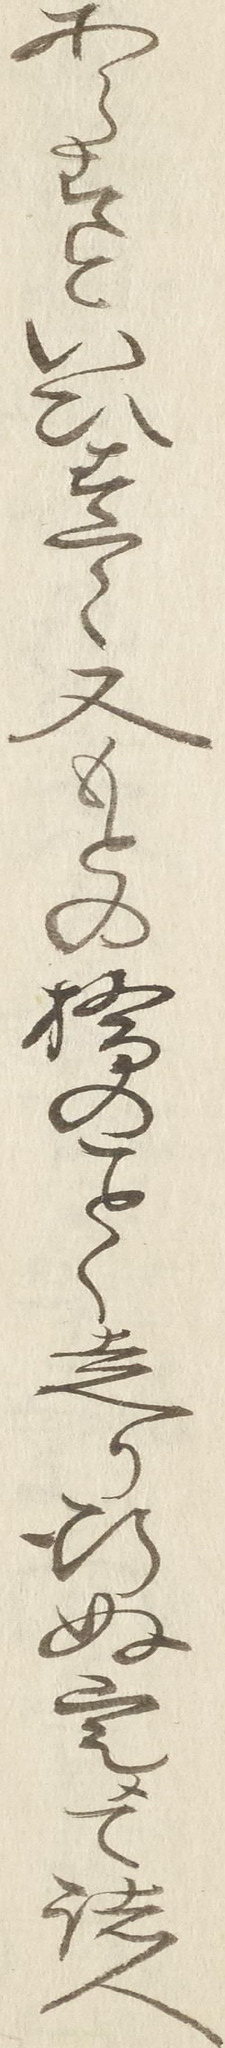あらすといひすてゝ又もとの橋のことく走り行ぬ定めて諸人
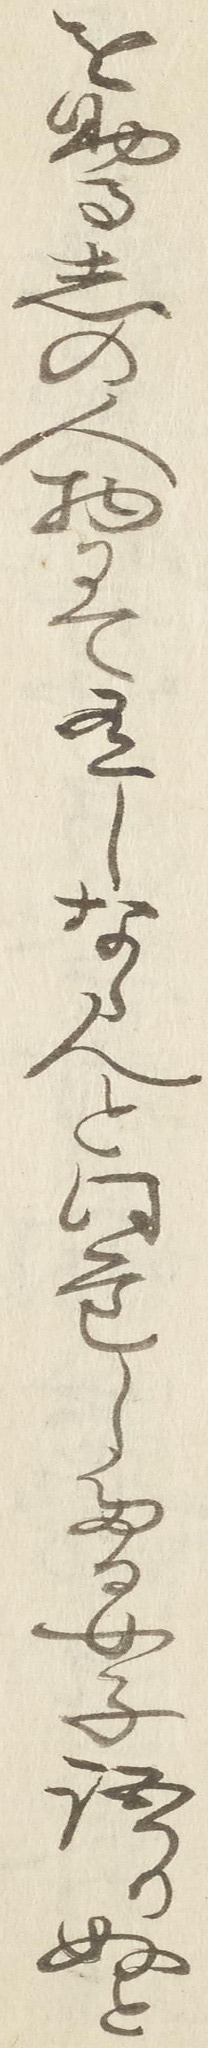を助る志の人物にて有しならんと同道したる女子語りぬと
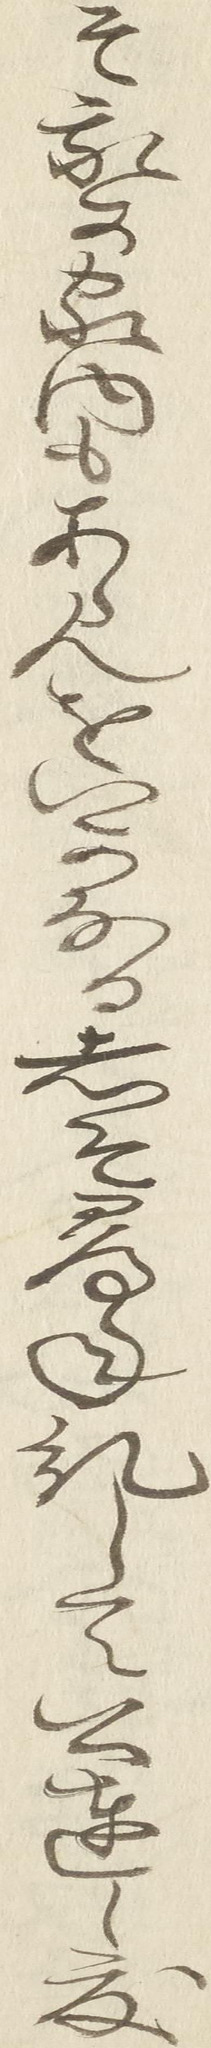そ我か家内もあらんをいかなる者そ尋ね糺して公達し度
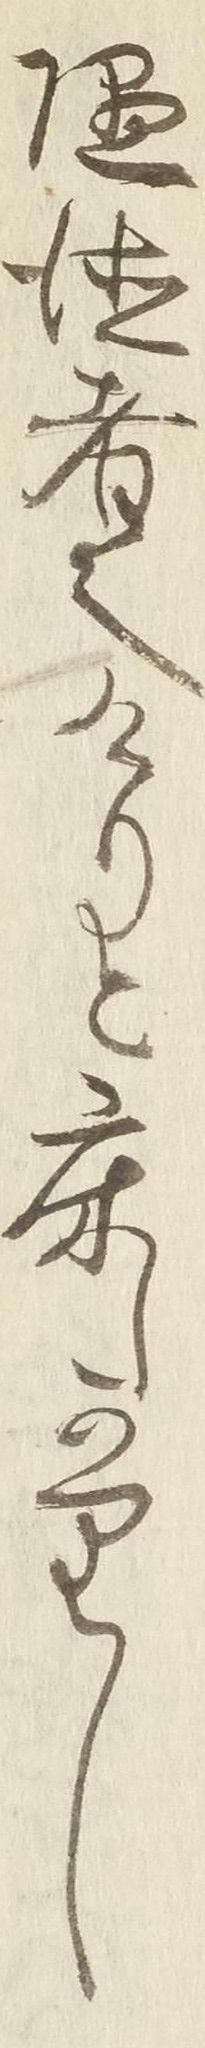隠徳者也けりと床しかりし
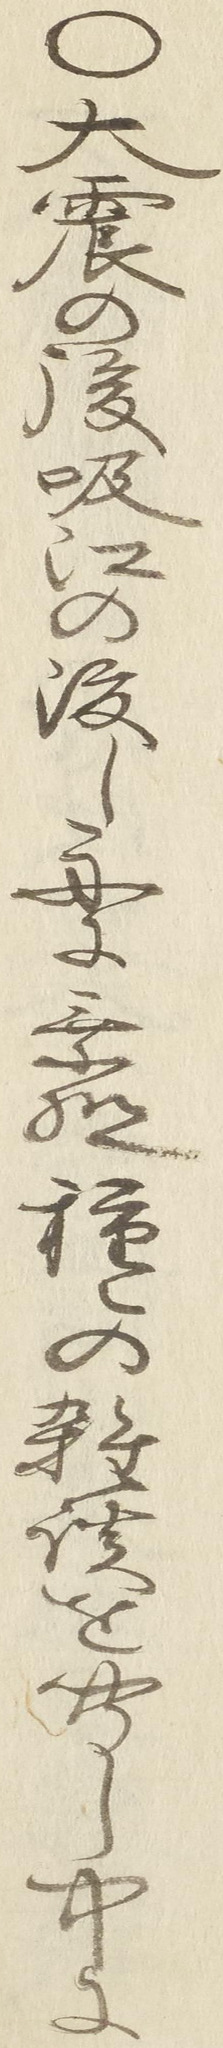〇大震の後吸江の渡し舟に乗組種々の雑談を聞し中に

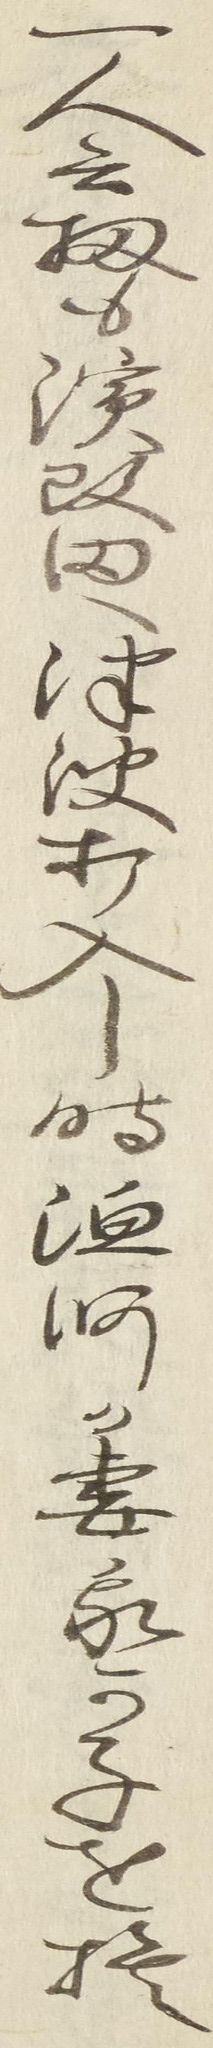一人云扨も浜改田へ津波打入し時漁師か妻我か子を捨
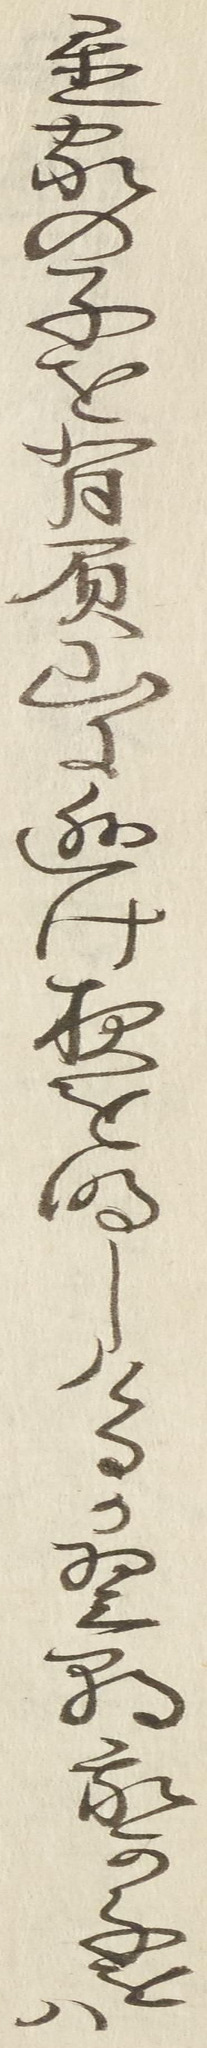置家の子を背負山に逃け夜を明しけるか翌朝我か子をは
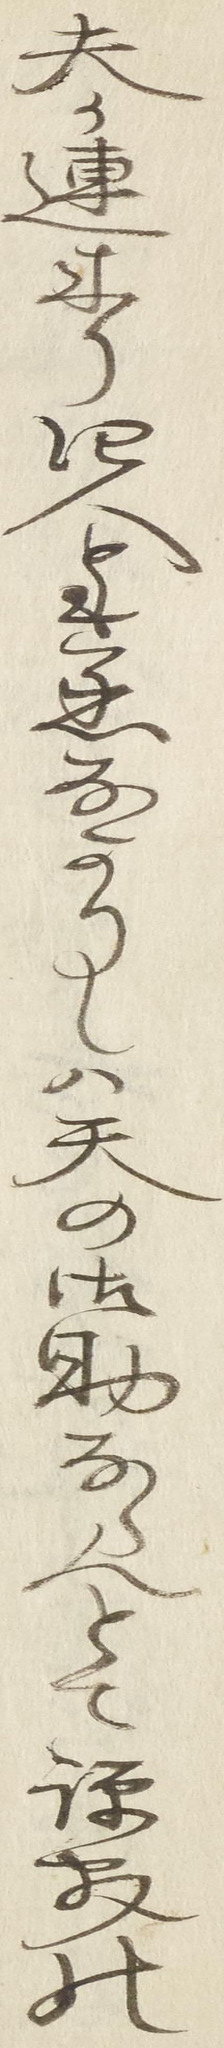夫か連来り四人とも恙なかりしは天の御助ならんとて評判の
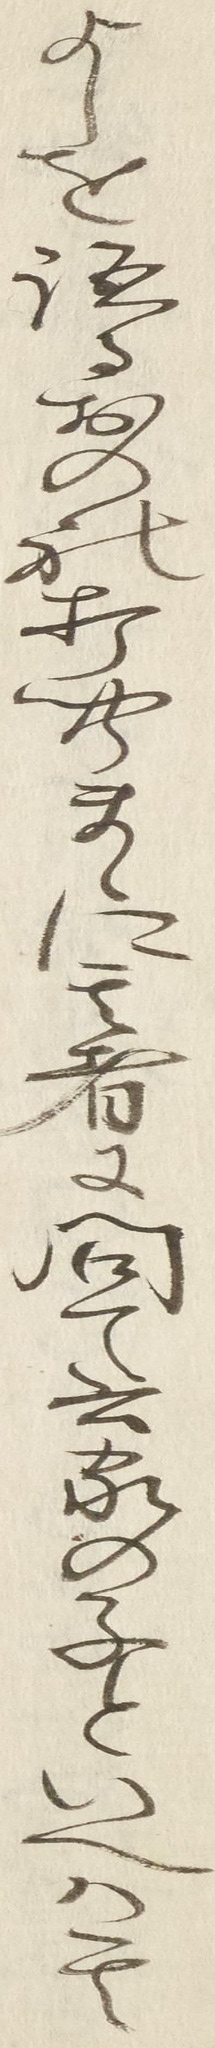よしを語るおのれ打聞まゝに其者に問て云家の子といへは其
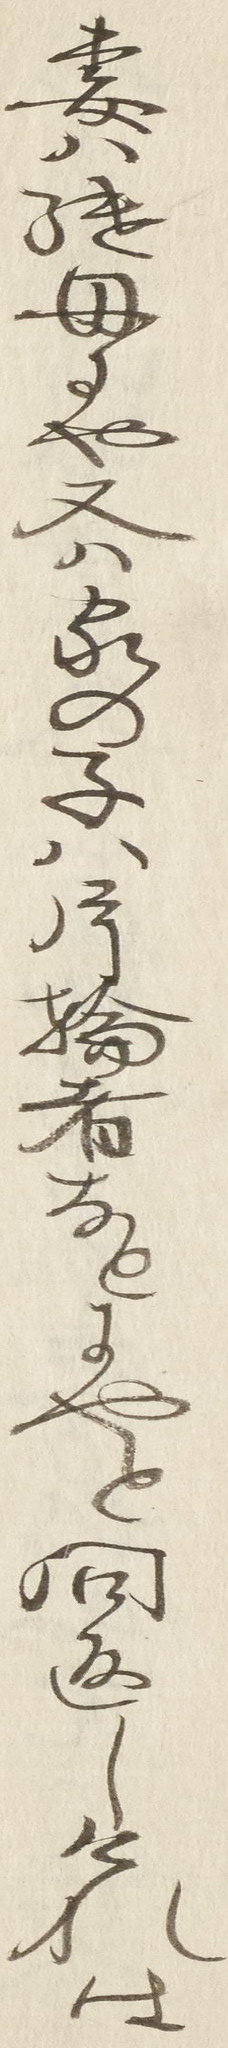妻は継母にや又は家の子は片輪者なとにやと問返しけれは
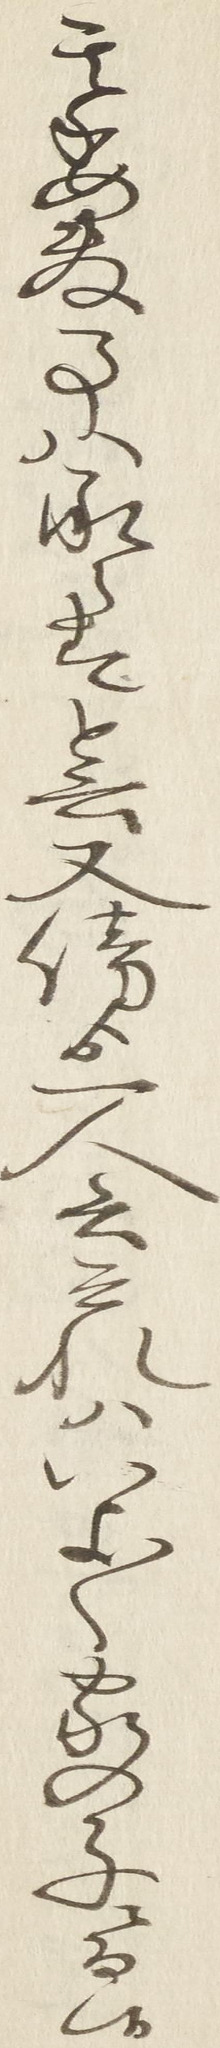其委敷事は承らすと云又傍より一人云それはいよ〳〵家の子にて候
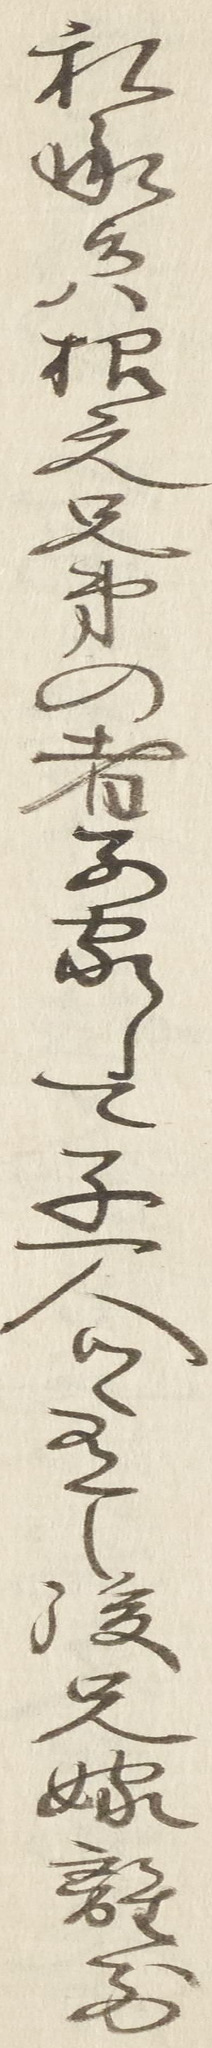私承候は根元兄弟の者別家して子一人つゝ有し後兄嫁離別
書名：地震記　上
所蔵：東京大学地震研究所図書室 Earthquake Research Institute Library, The University of Tokyo, JAPAN
